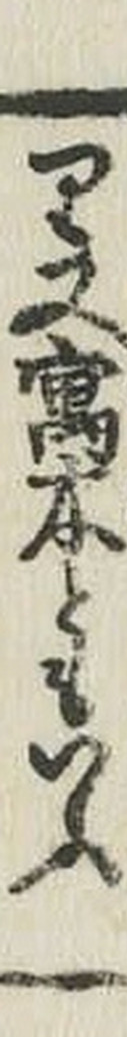り又寓木ともいふ
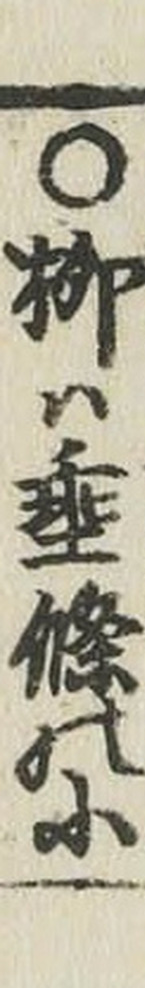○柳は垂條の小
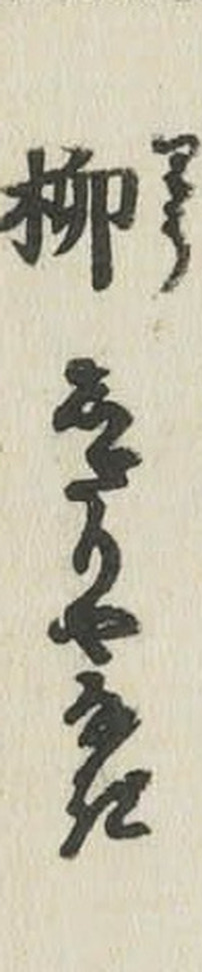柳したりやなぎ
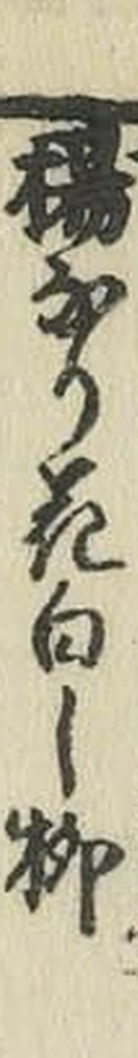楊なり花白し柳
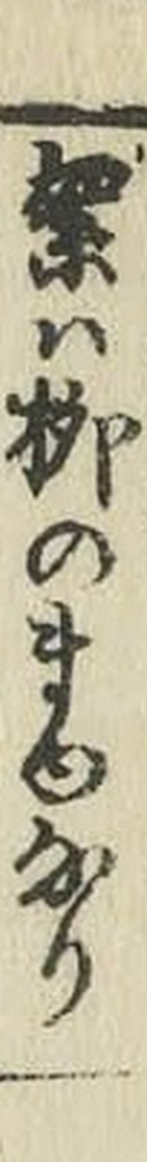絮は柳のまゆなり
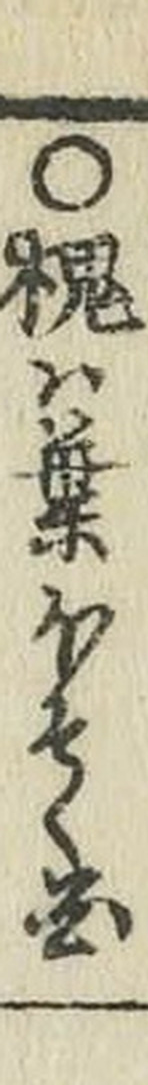○槐は葉ほそく花
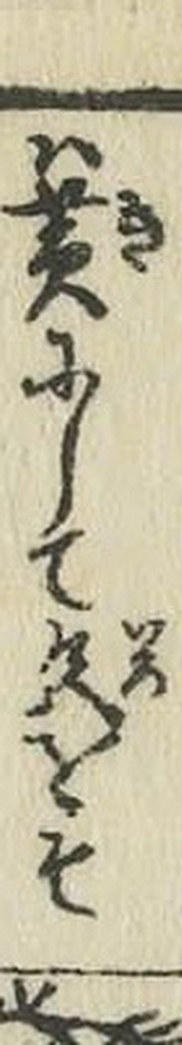は黄にして色をそ
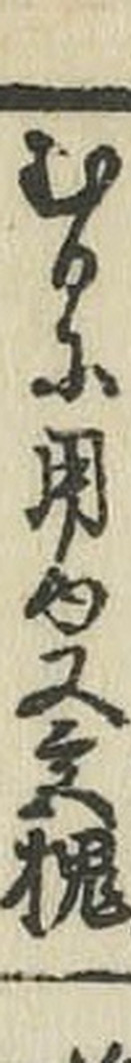むるに用ゆ又宮槐
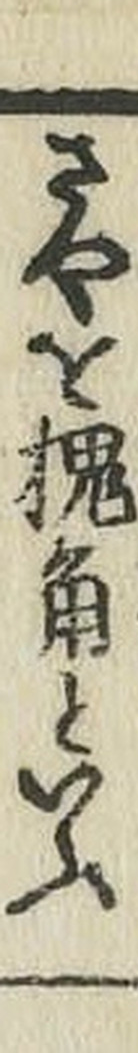さやを槐角といふ
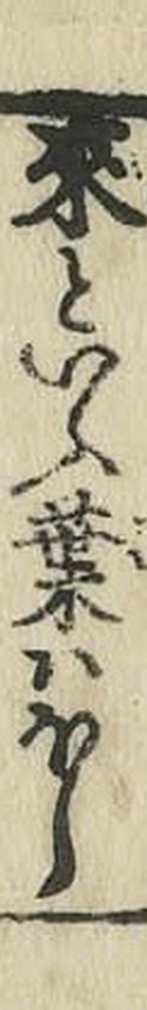来といふ葉はほし
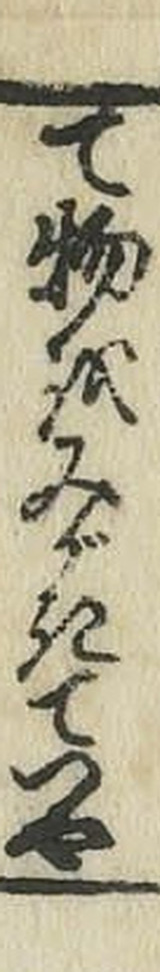て物をみがきてつや
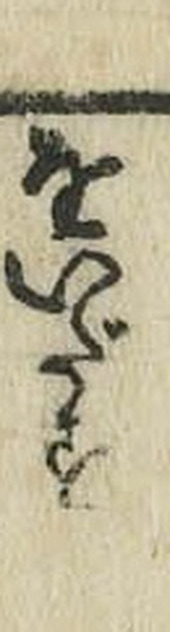をいだす
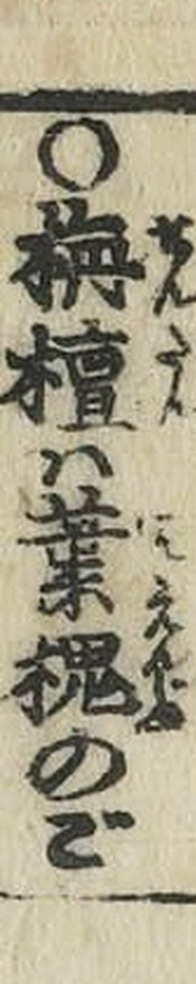○栴檀は葉槐のご
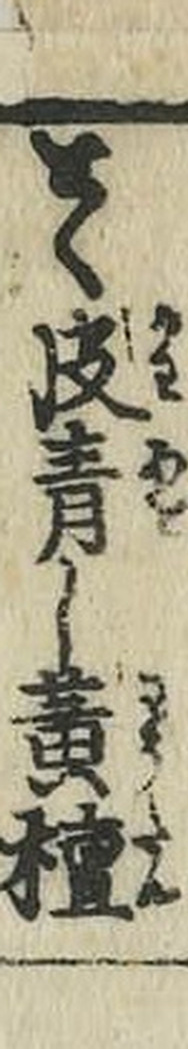とく皮青し黄檀

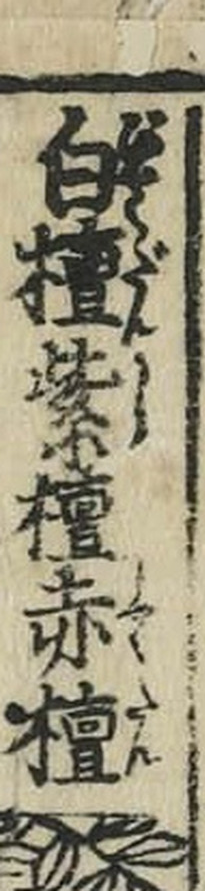白檀紫檀赤檀
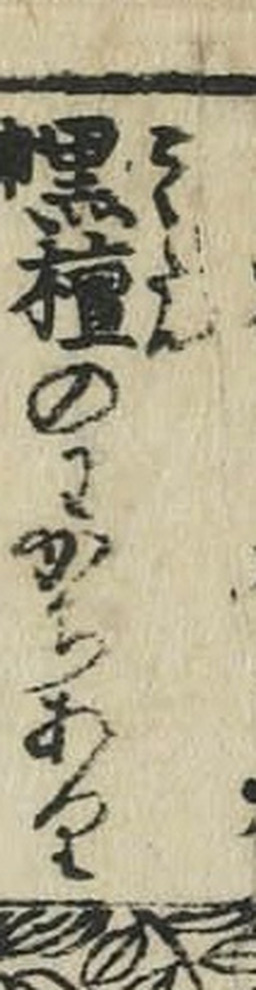黒檀のわかちあり
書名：増補頭書訓蒙図彙大成 10巻 8:巻之17-19
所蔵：東京学芸大学教育コンテンツアーカイブ
